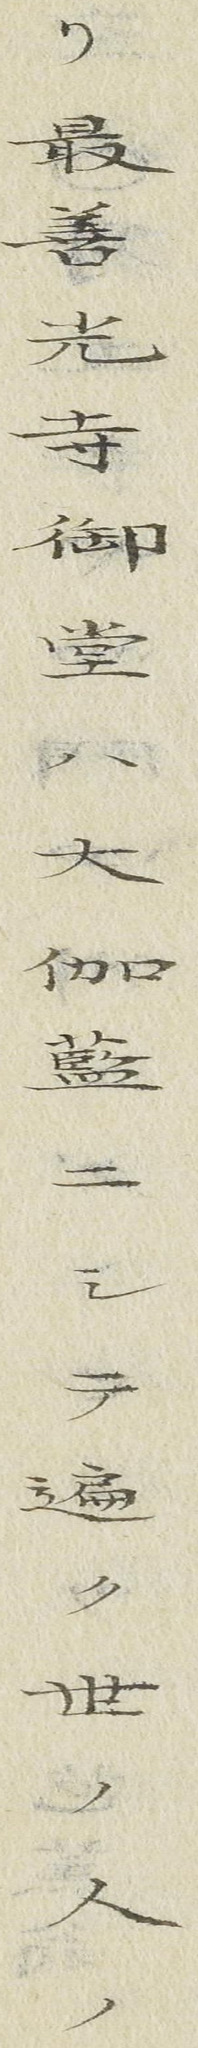リ最善光寺御堂ハ大伽藍ニシテ遍ク世ノ人ノ
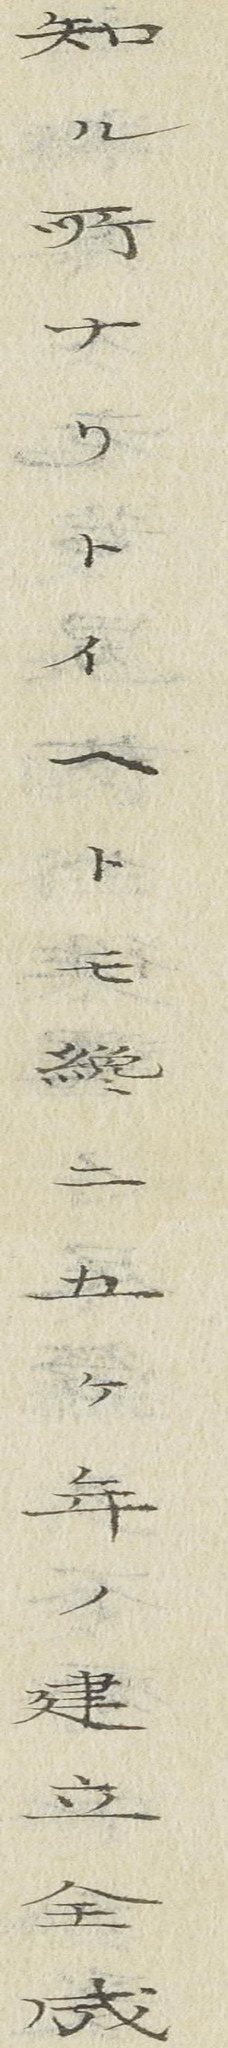知ル所ナリトイヘトモ纔ニ五ケ年ノ建立全成
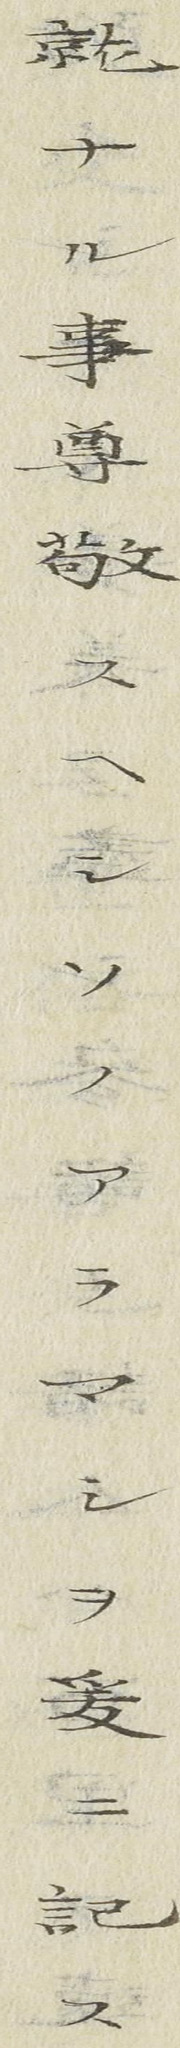就ナル事尊敬スヘシソノアラマシヲ爰ニ記ス
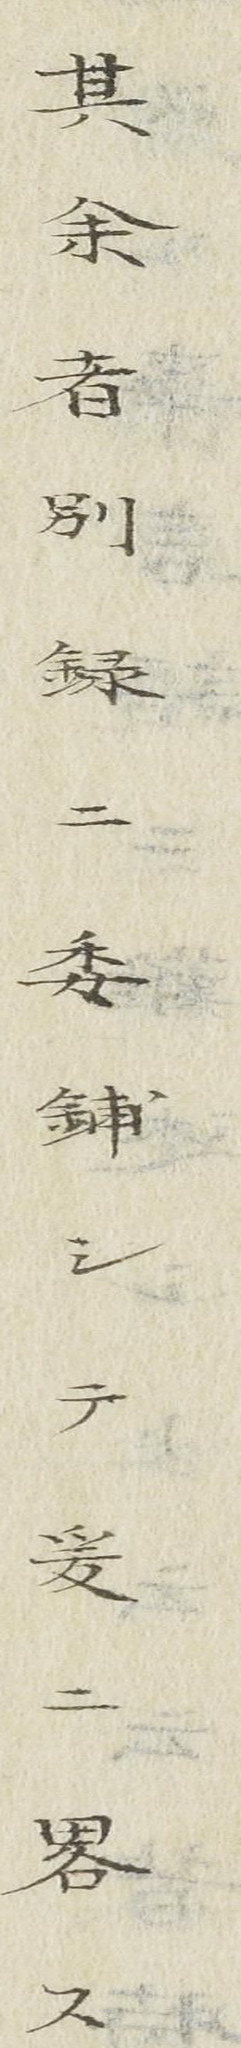其余者別録ニ委鋪シテ爰ニ略ス

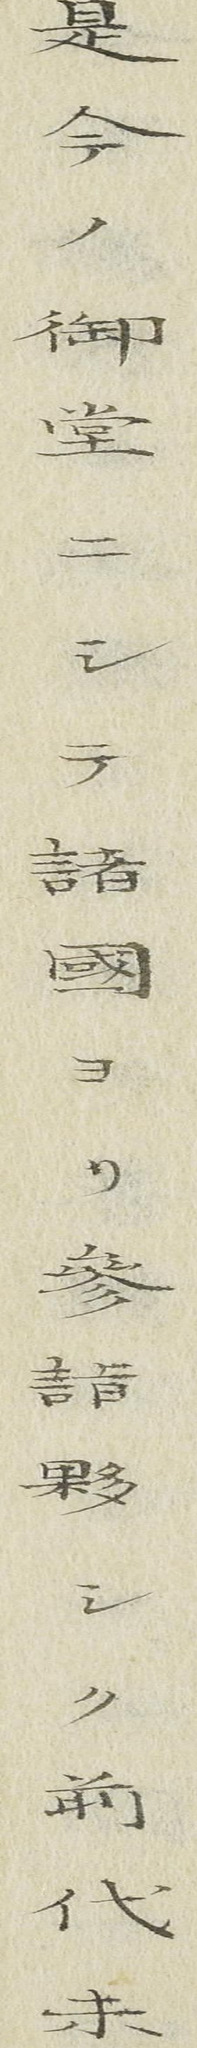是今ノ御堂ニシテ諸国ヨリ参詣夥シク前代未
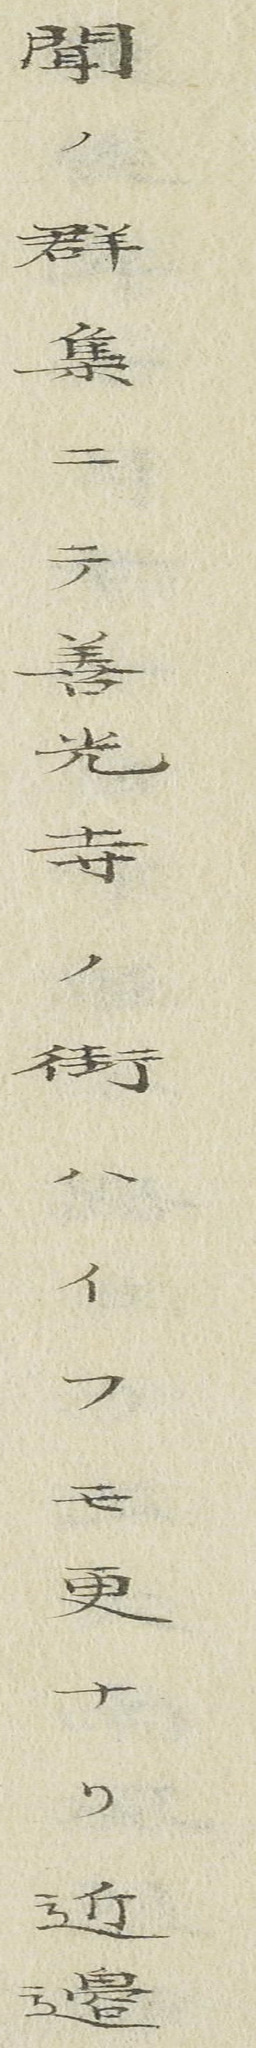聞ノ群集ニテ善光寺ノ街ハイフモ更ナリ近辺
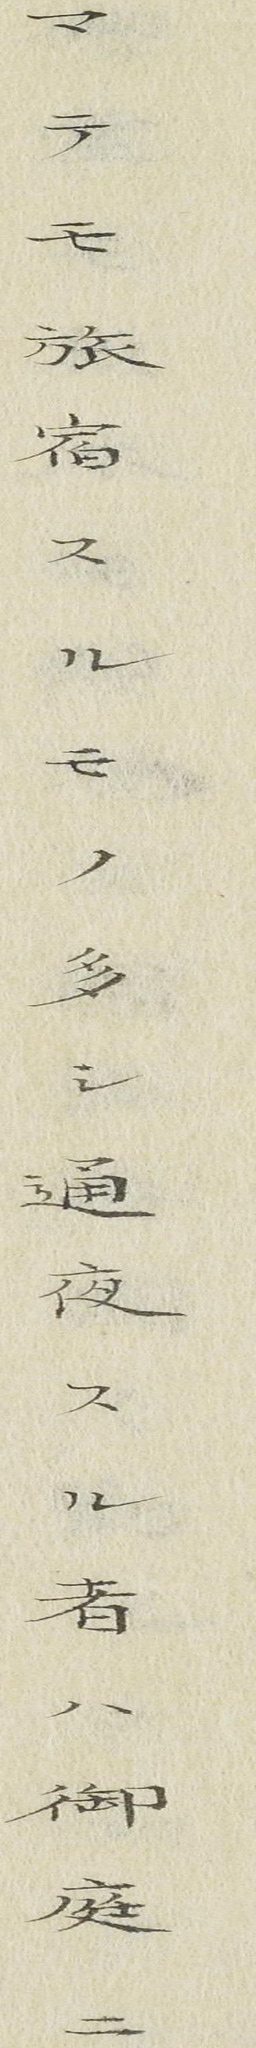マテモ旅宿スルモノ多シ通夜スル者ハ御庭ニ
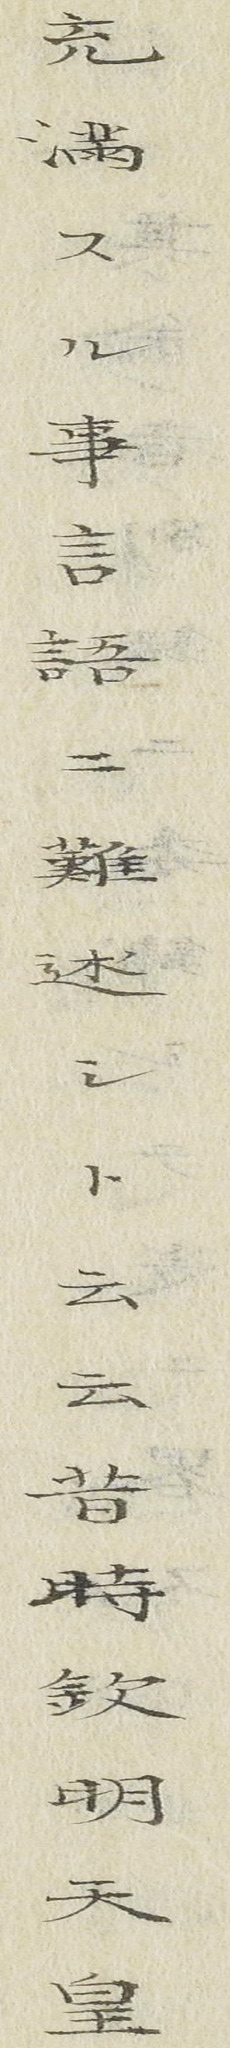充満スル事言語ニ難述シト云云昔時欽明天皇
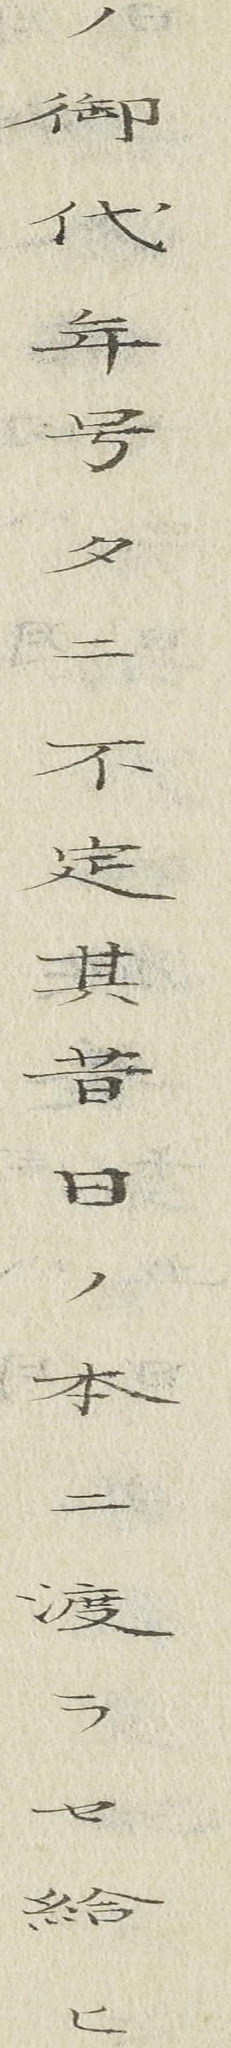ノ御代年号タニ不定其昔日ノ本ニ渡ラセ給ヒ
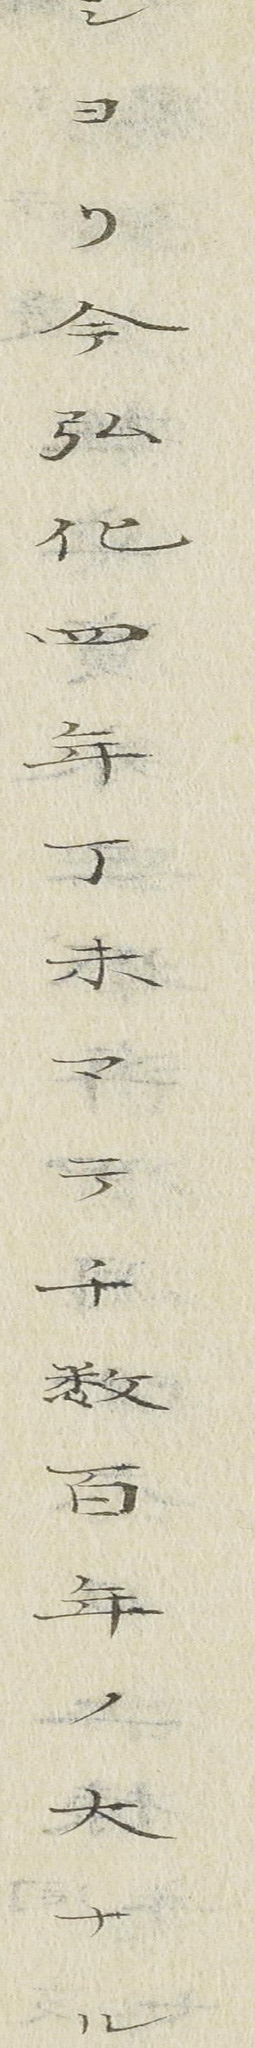シヨリ今弘化四年丁未マテ千数百年ノ大ナル
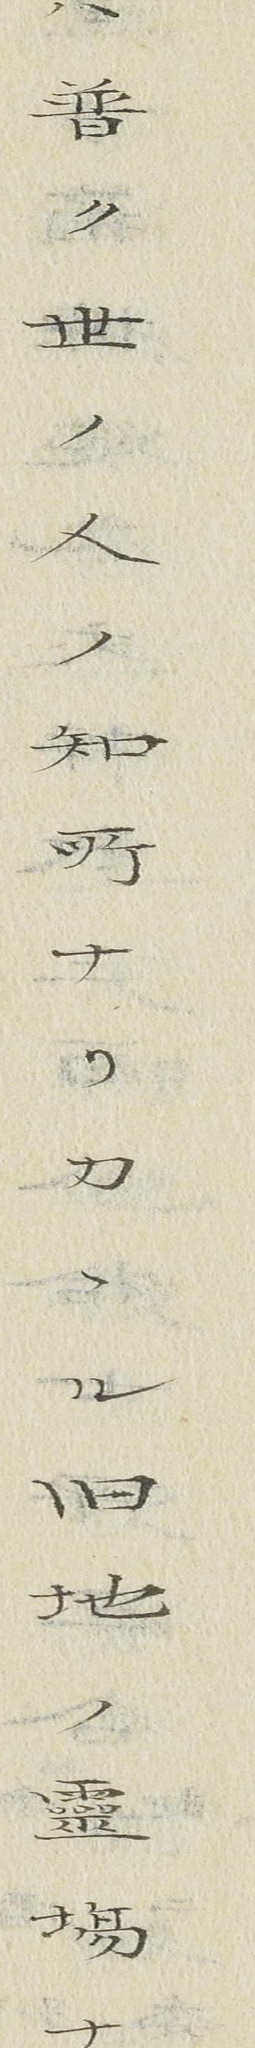ハ普ク世ノ人ノ知所ナリカヽル旧地ノ霊場ナ
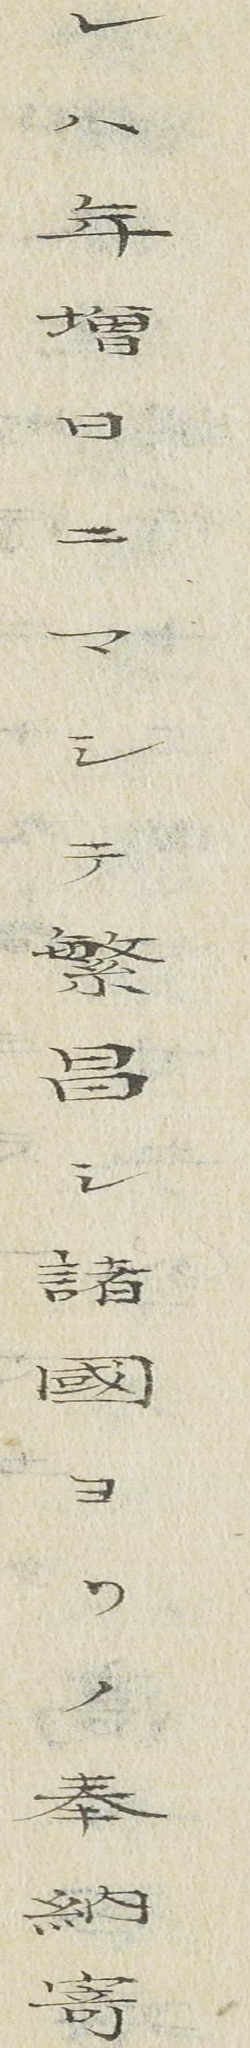レハ年増日ニマシテ繁昌シ諸国ヨリノ奉納寄
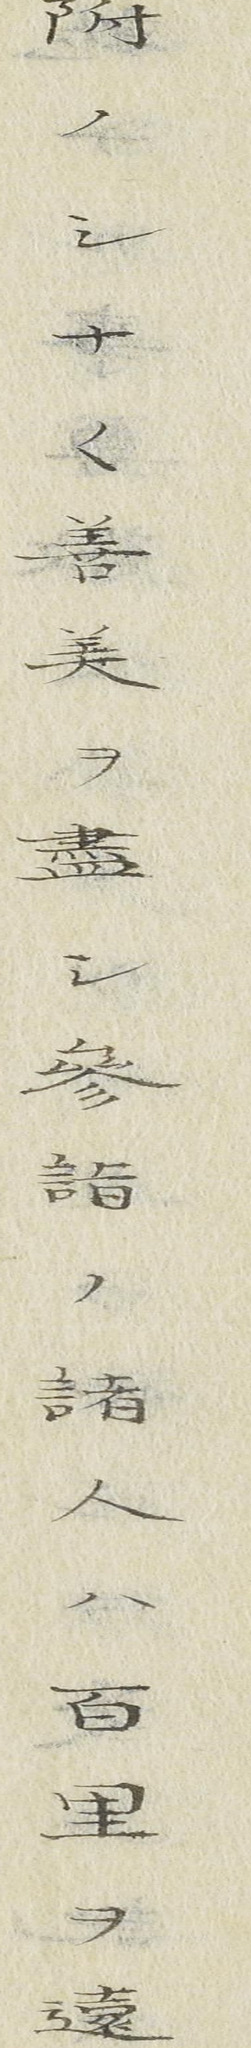附ノシナゝ善美ヲ尽シ参詣ノ諸人ハ百里ヲ遠
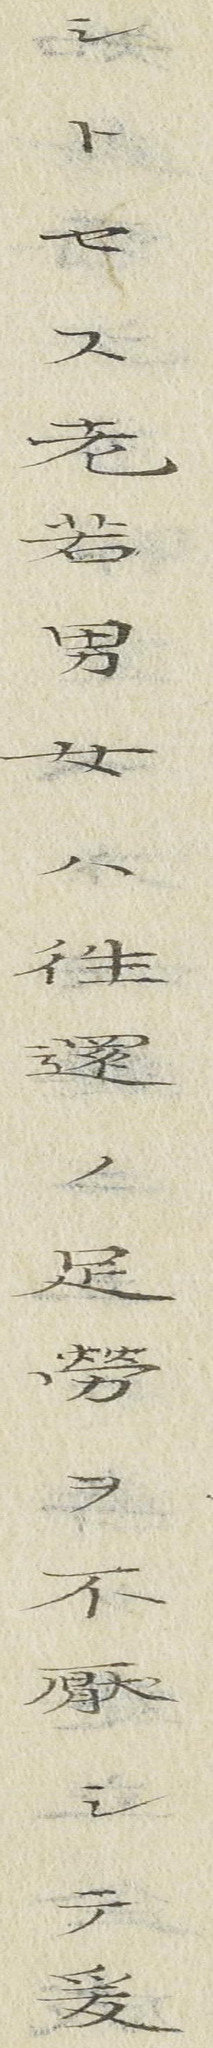シトセス老若男女ハ往還ノ足労ヲ不厭シテ爰
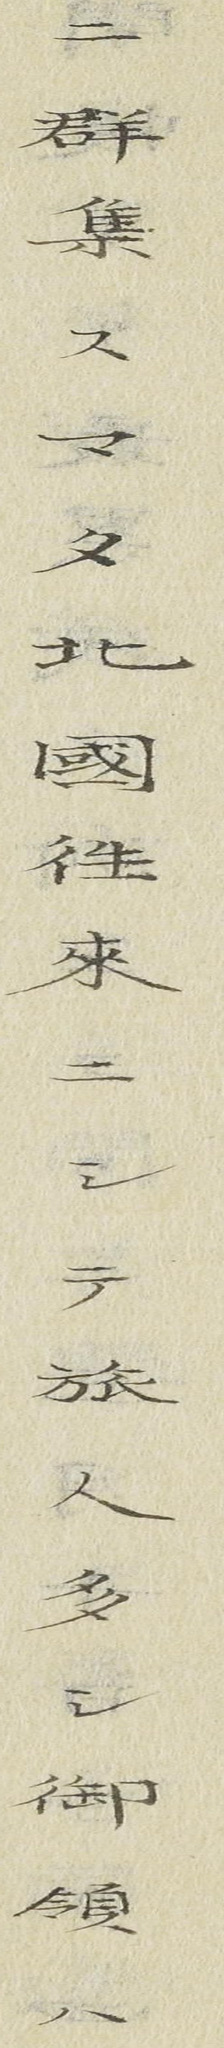ニ群集スマタ北国往来ニシテ旅人多シ御領ハ
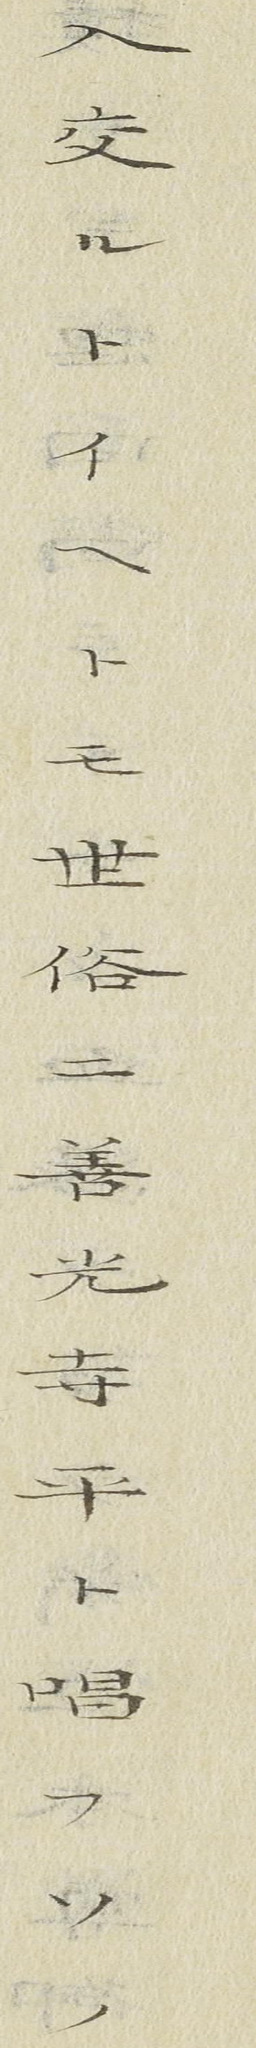入交ルトイヘトモ世俗ニ善光寺平ト唱フソノ
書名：地災撮要　地震之部　巻ノ二
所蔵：東京大学地震研究所図書室 Earthquake Research Institute Library, The University of Tokyo, JAPAN
